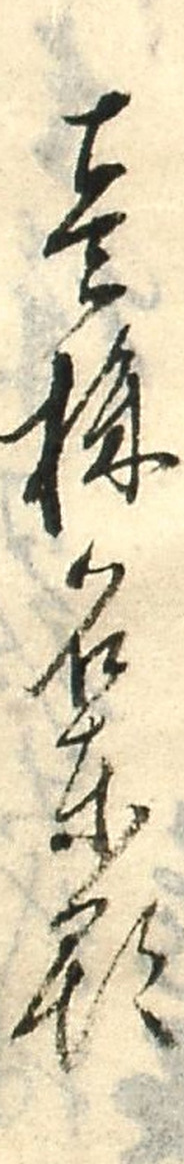壱株名東郡
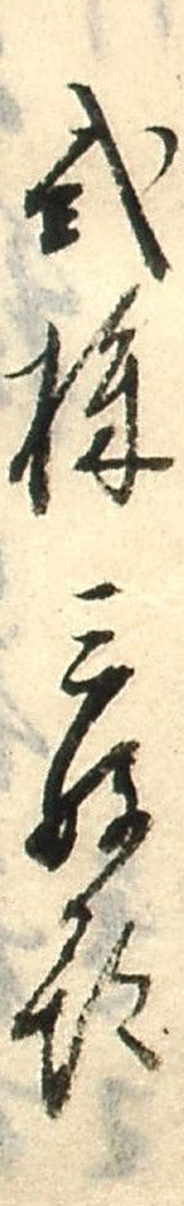弐株三好郡
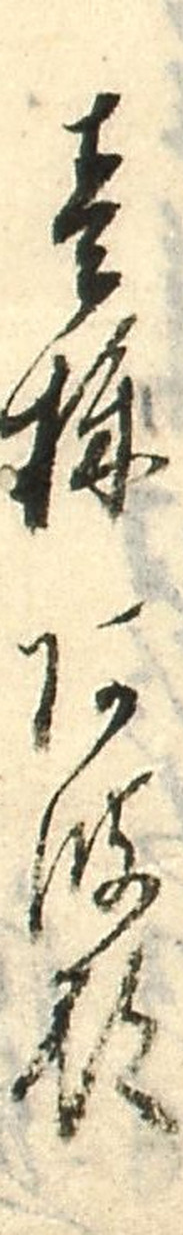壱株阿波郡
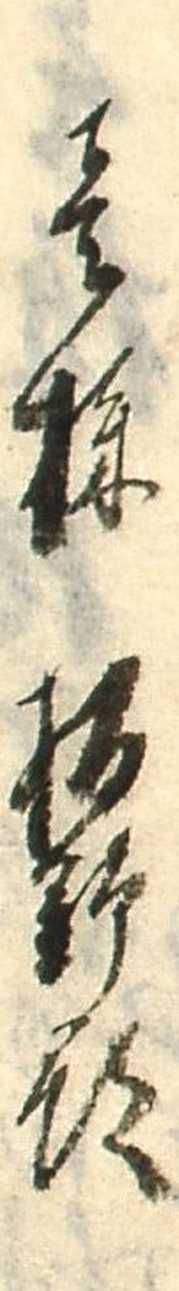壱株板野郡
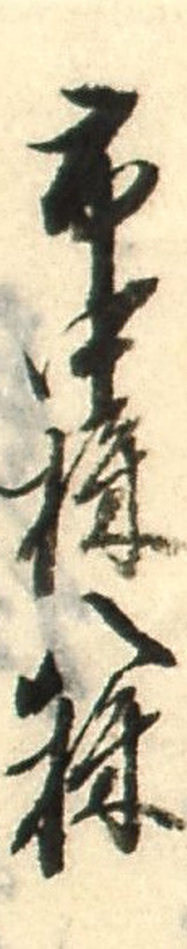市中株八株
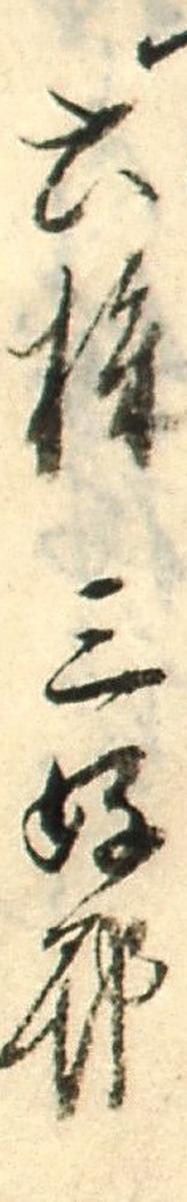六株三好郡
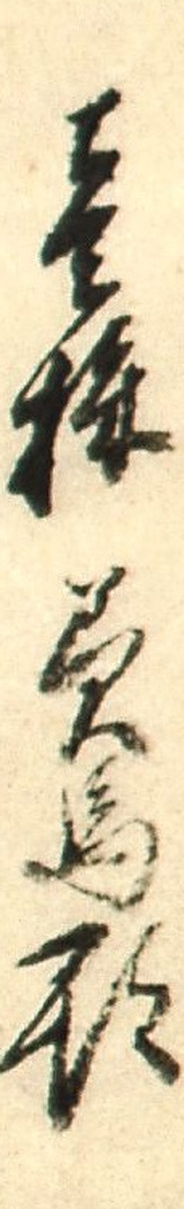壱株美馬郡
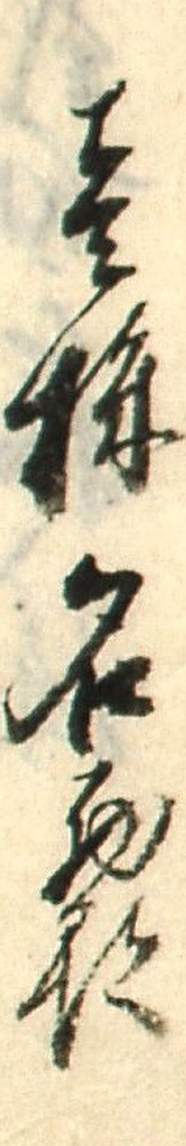壱株名西郡

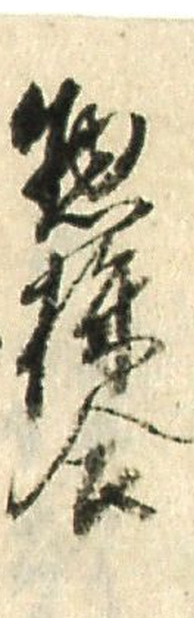惣株合
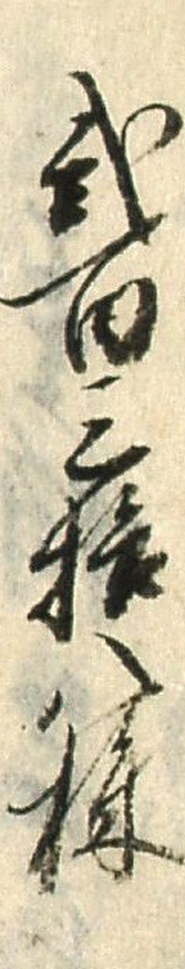弐百三拾八株
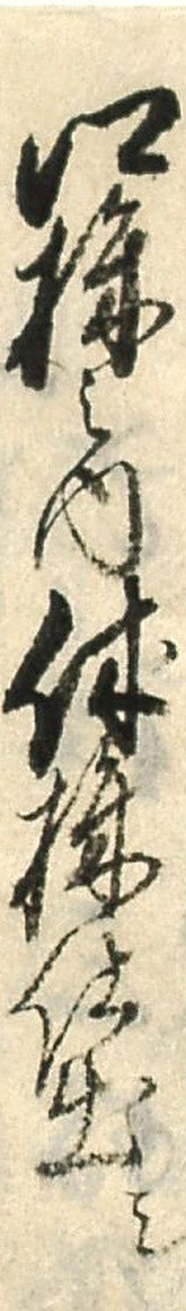郷株之内休株仕出し
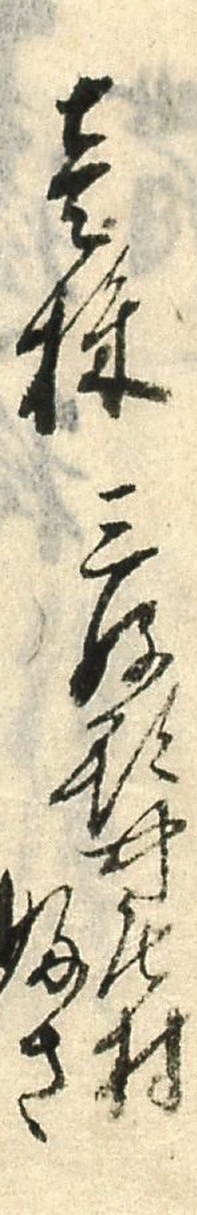壱株三好郡中庄村
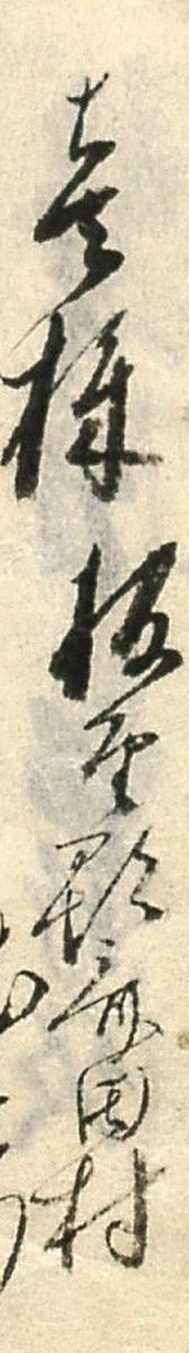壱株板野郡斎田村
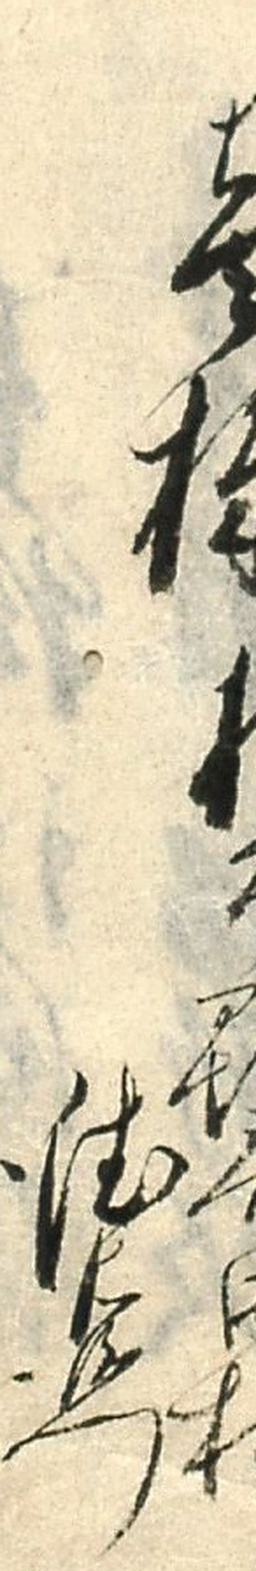徳右衛門
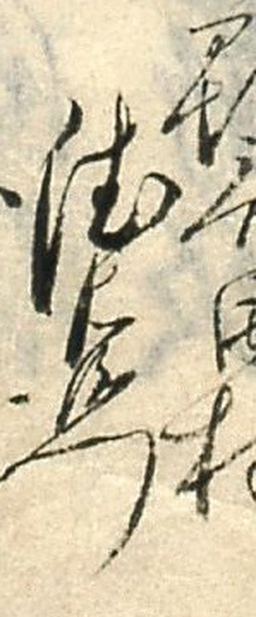徳右衛門
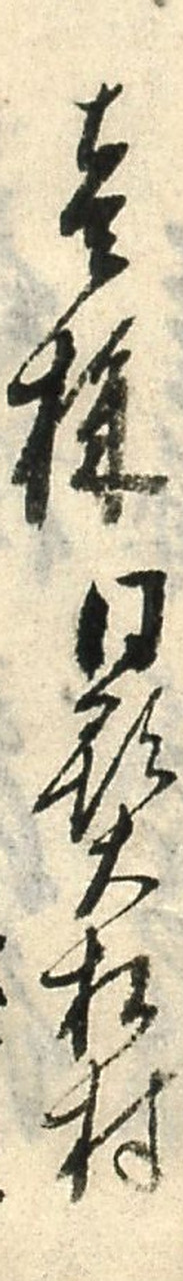壱株同郡大松村
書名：南北拾郡造酒屋数並株数調子帳
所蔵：鳴門教育大学 Naruto University of Education
